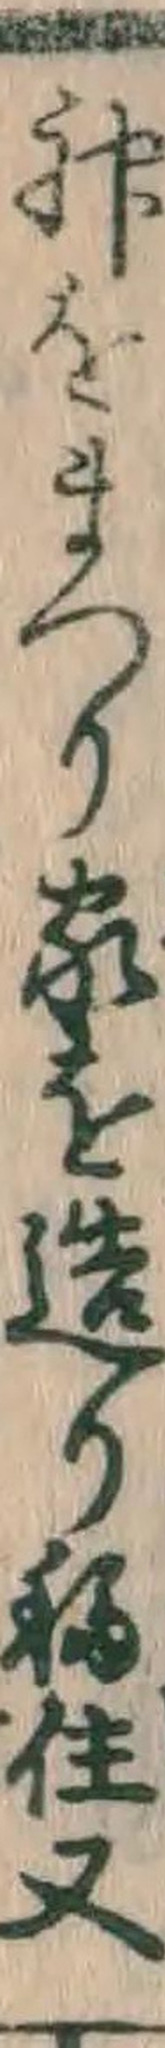神をまつり家を造り移住又
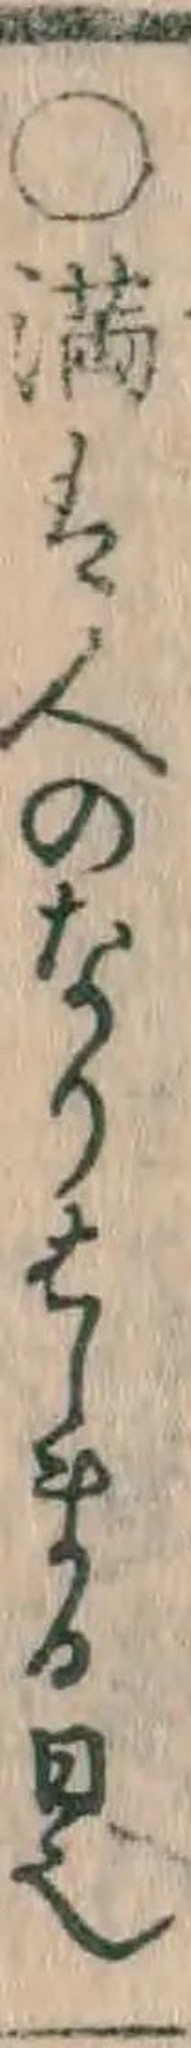○満は人のなりはしまる日也
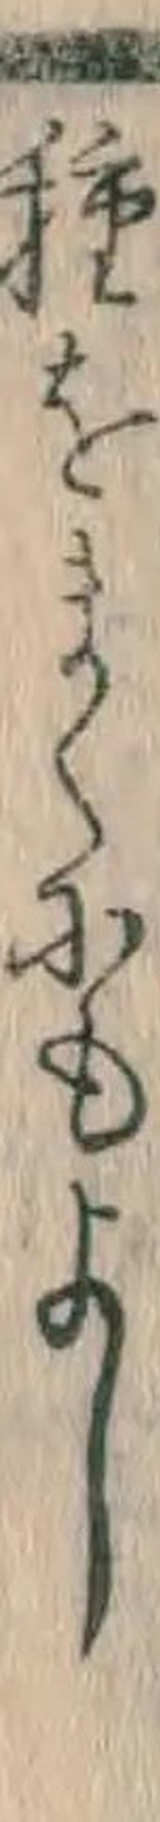種をまくにもよし
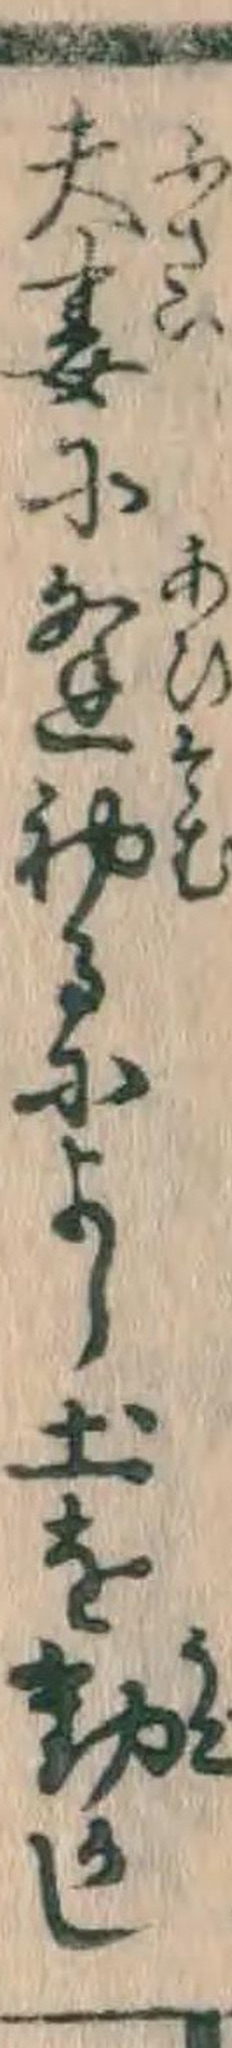夫妻に逢初るによし土を動かし
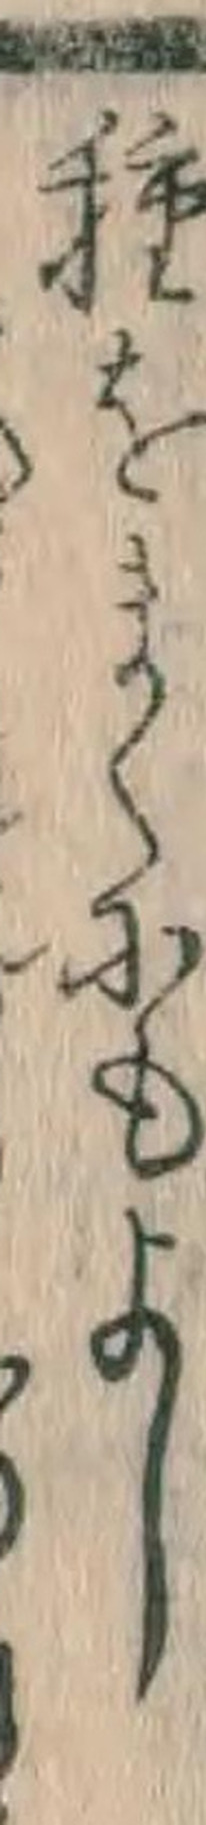種をまくにもよし
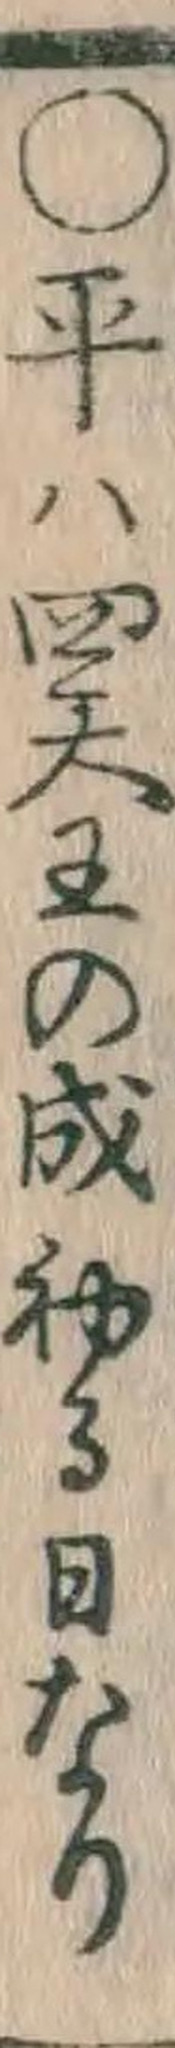○平は四天王の成初る日なり
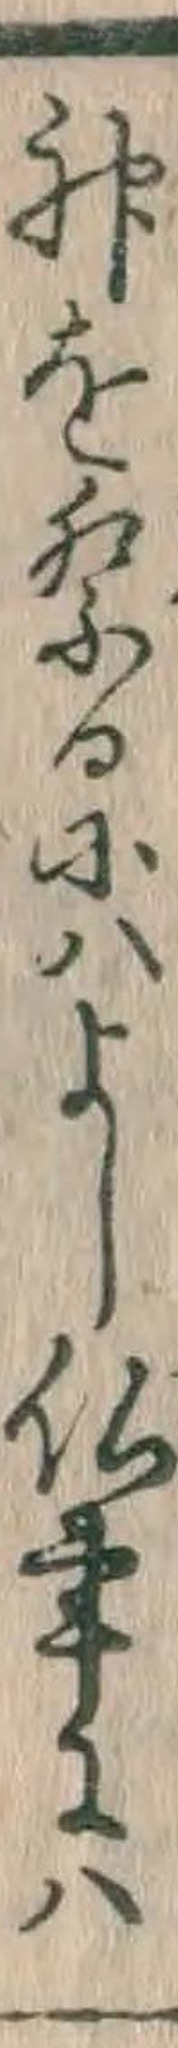神を祭るにはよし仏事には
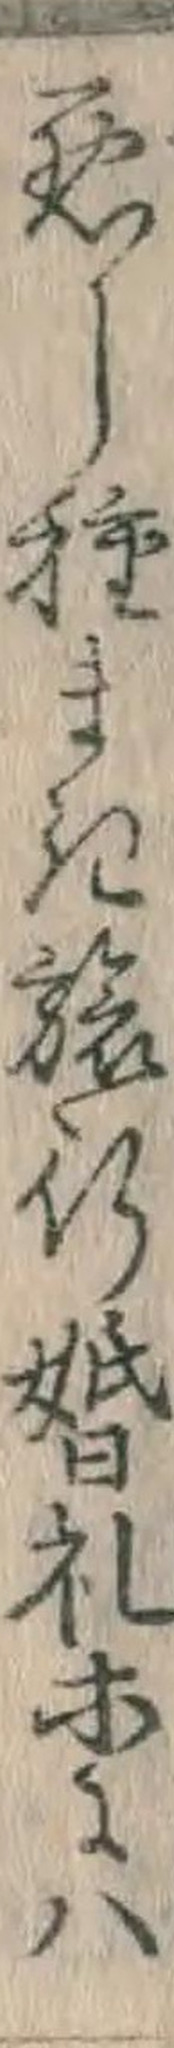悪し種まき旅行婚礼等には
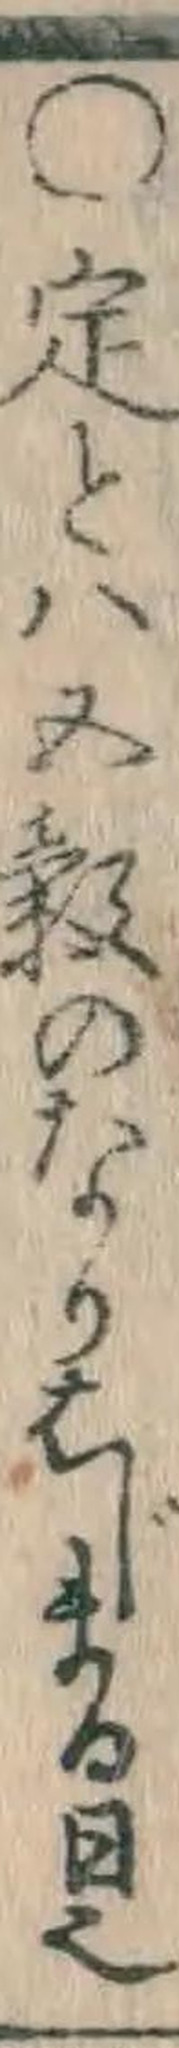○定とは五穀のなりはじまる日也
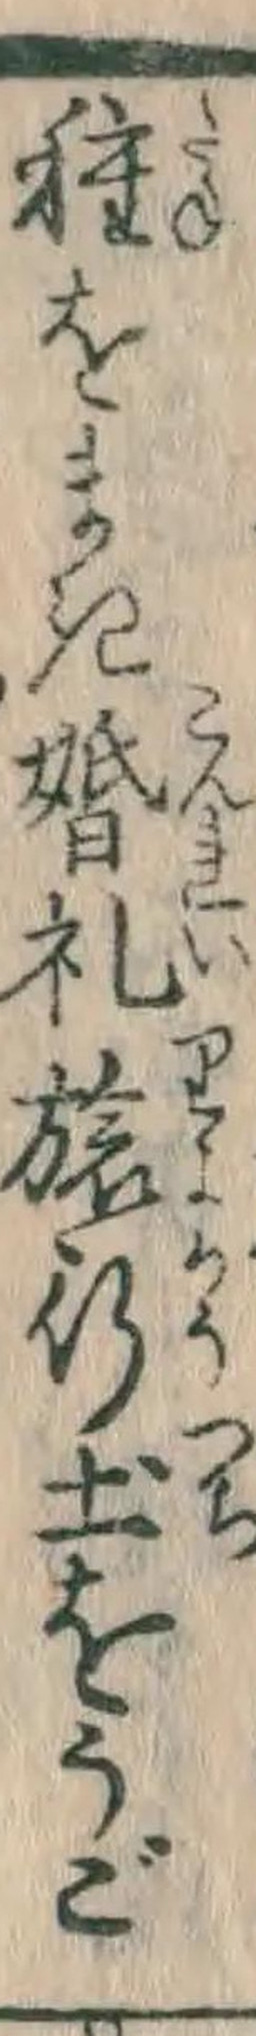種をまき婚礼旅行土をうご
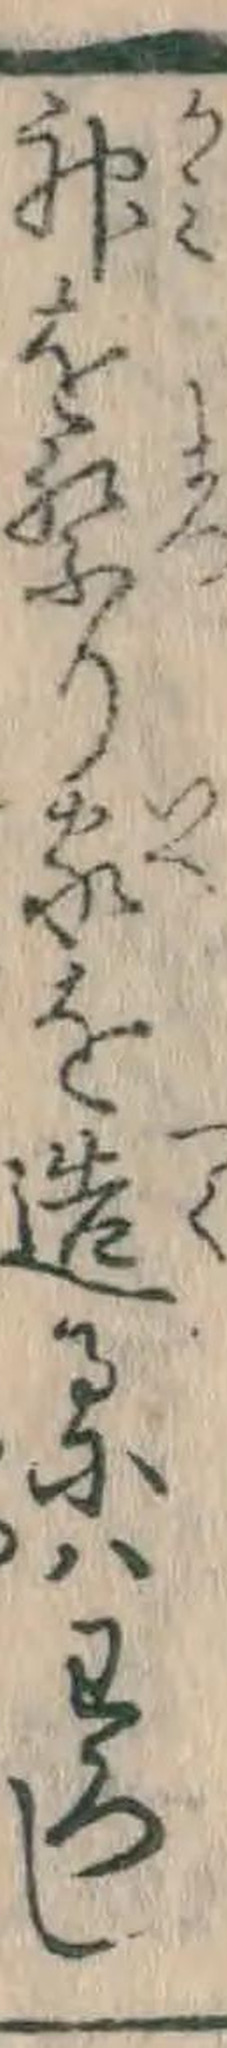神を祭り家を造るにはわろし
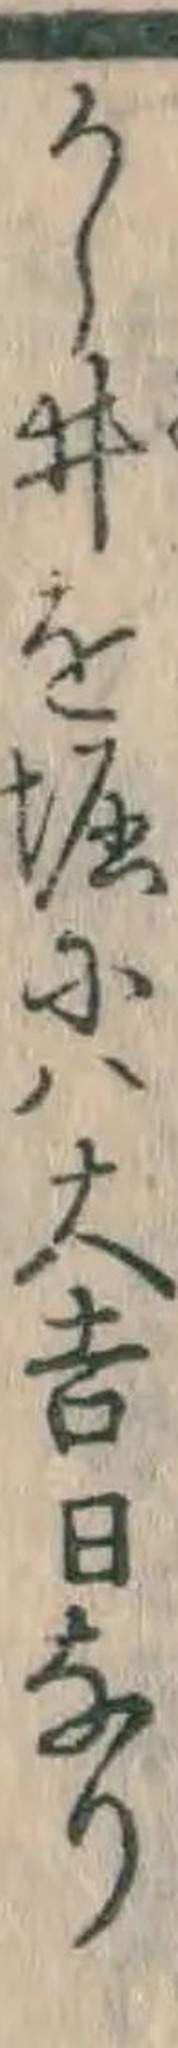かし井を掘には大吉日なり
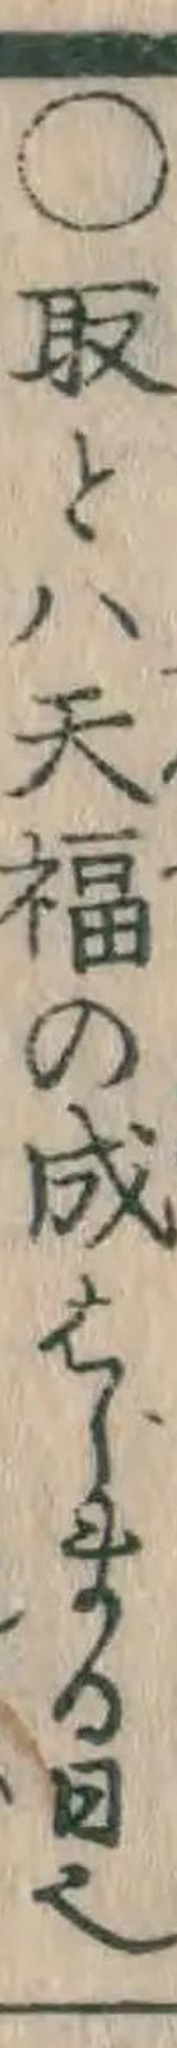○取とは天福の成はじまる日也
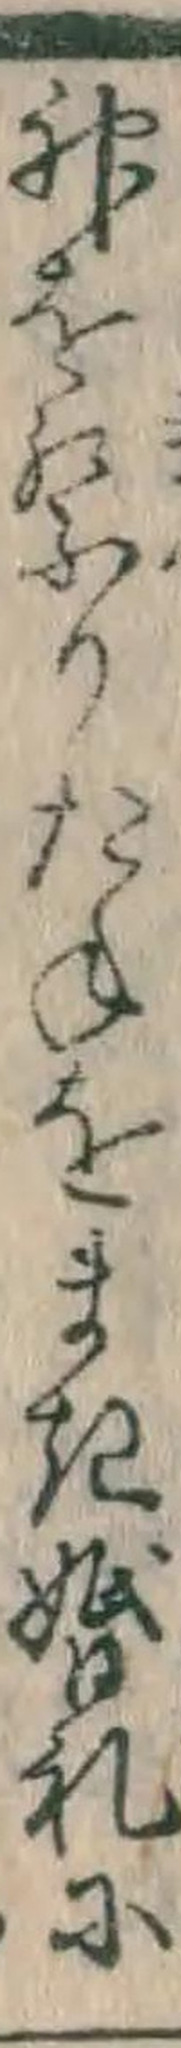神を祭りたねをまき婚礼に
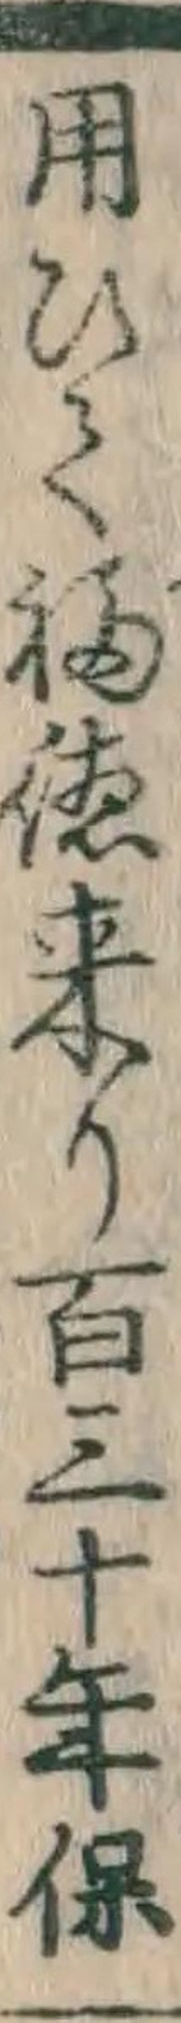用ひて福徳来り百三十年保
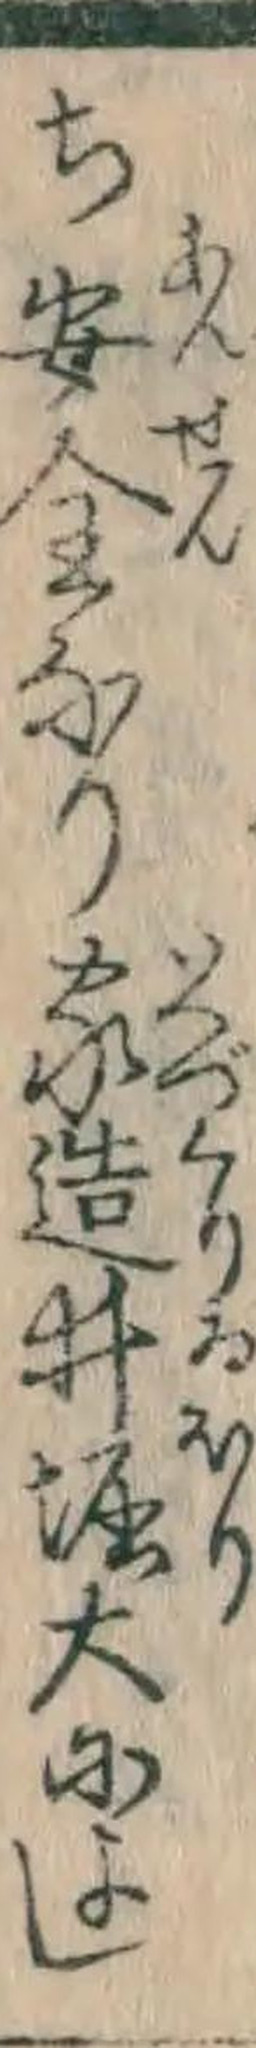ち安全なり家造井掘大によし
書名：広益秘事大全 3巻. [4]
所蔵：国立国会図書館 National Diet Library, JAPAN
